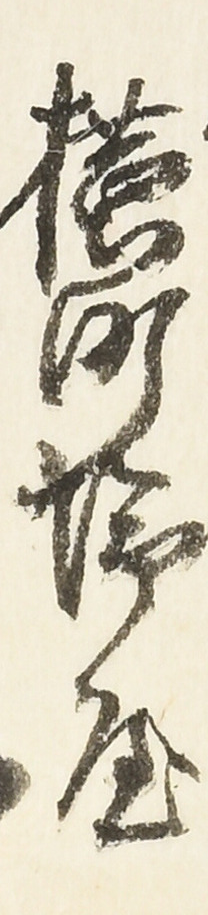横町塩屋
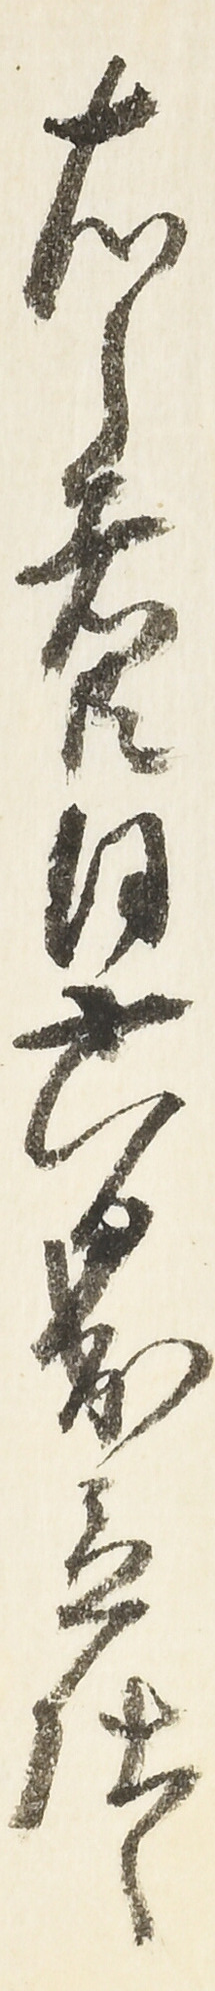右之者共同六日出立仕候
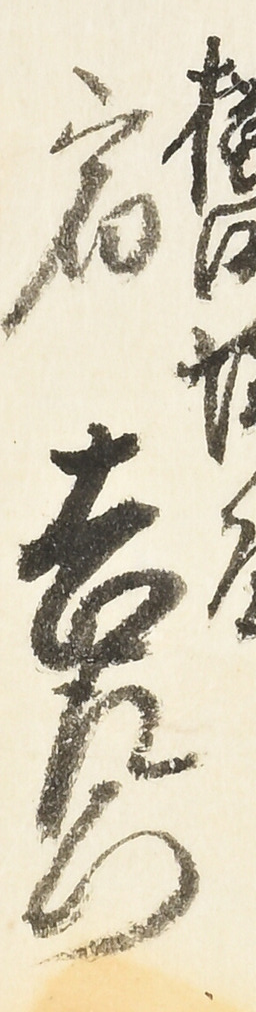宿吉左衛門
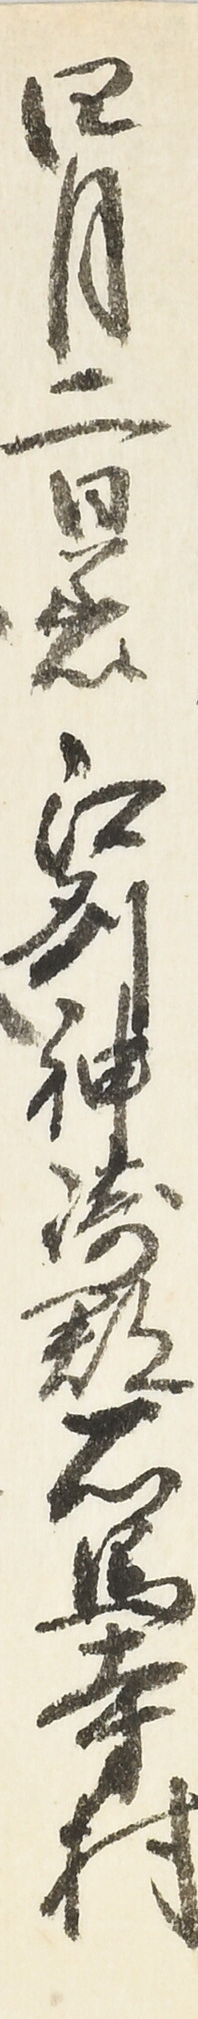四月二日着江州神崎郡石馬寺村
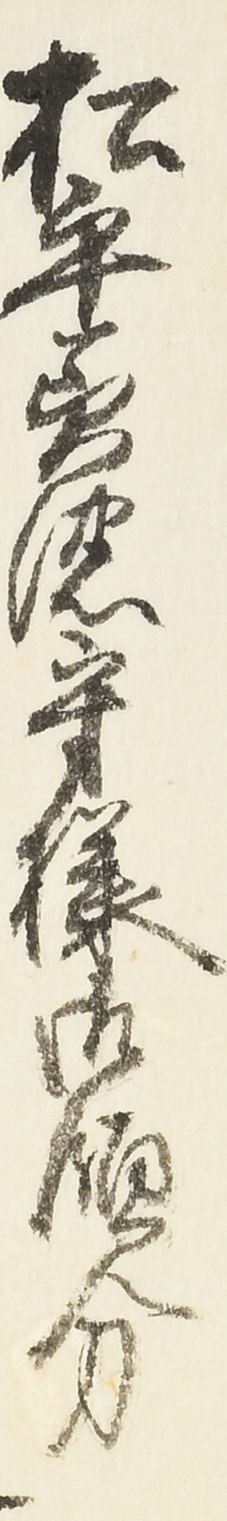松平美濃守様御領分
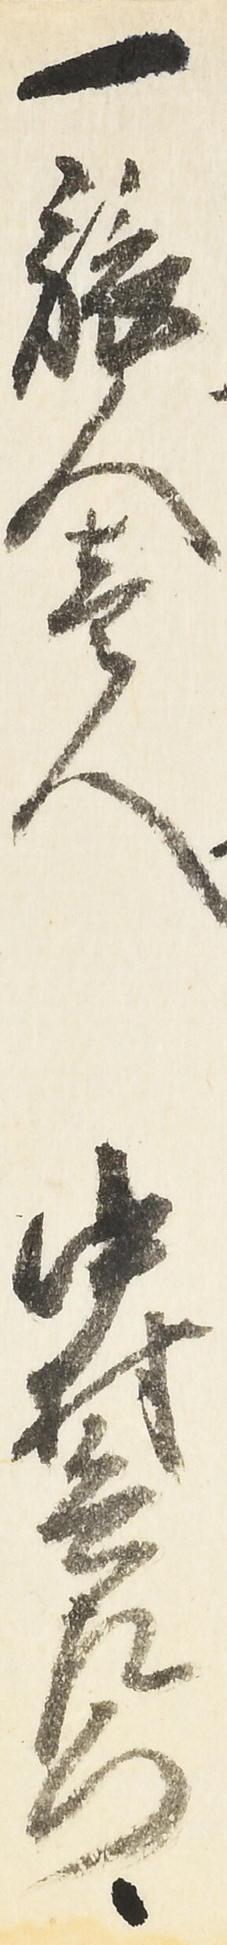一旅人壱人中村兵左衛門・
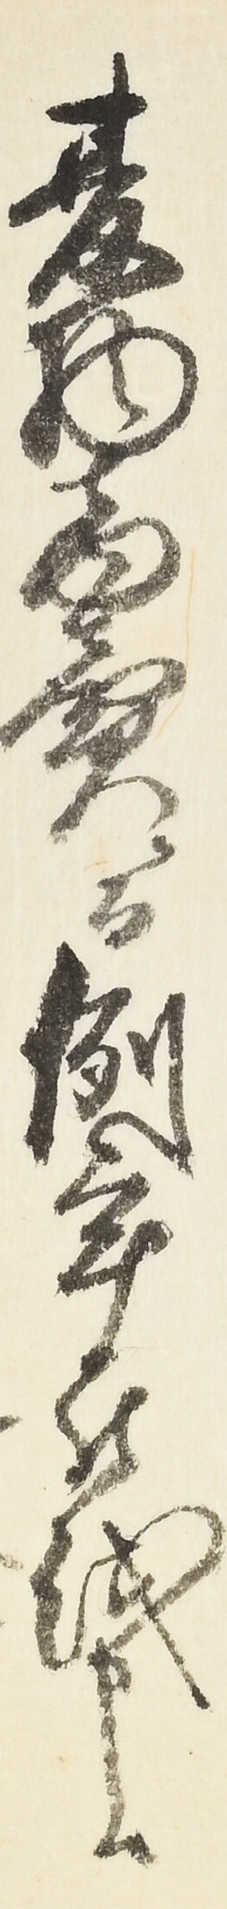夏物商売ニ而例年罷越申候
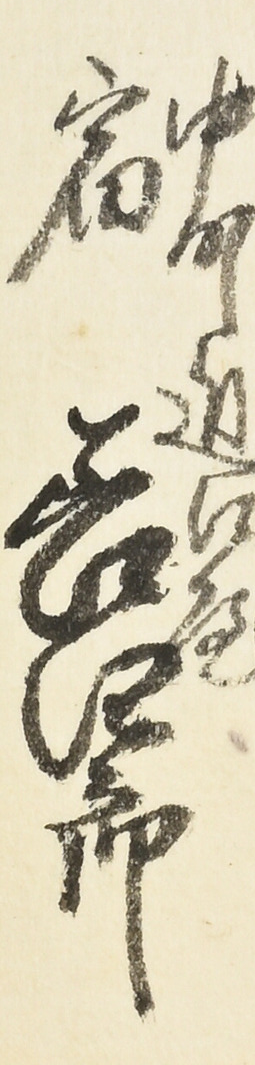宿善四郎
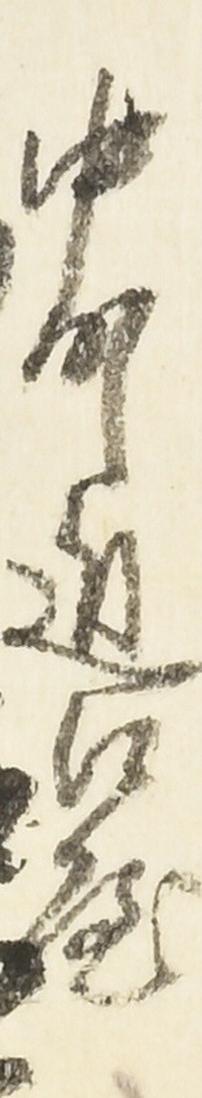中町近江屋
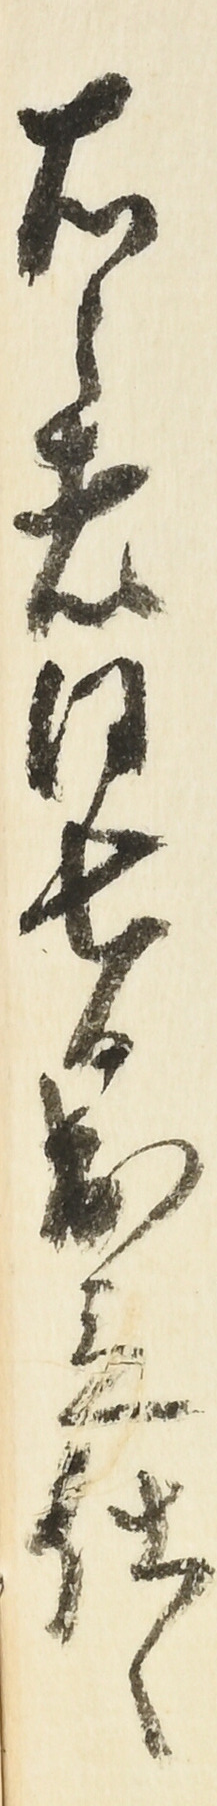右之者同七日出立仕候

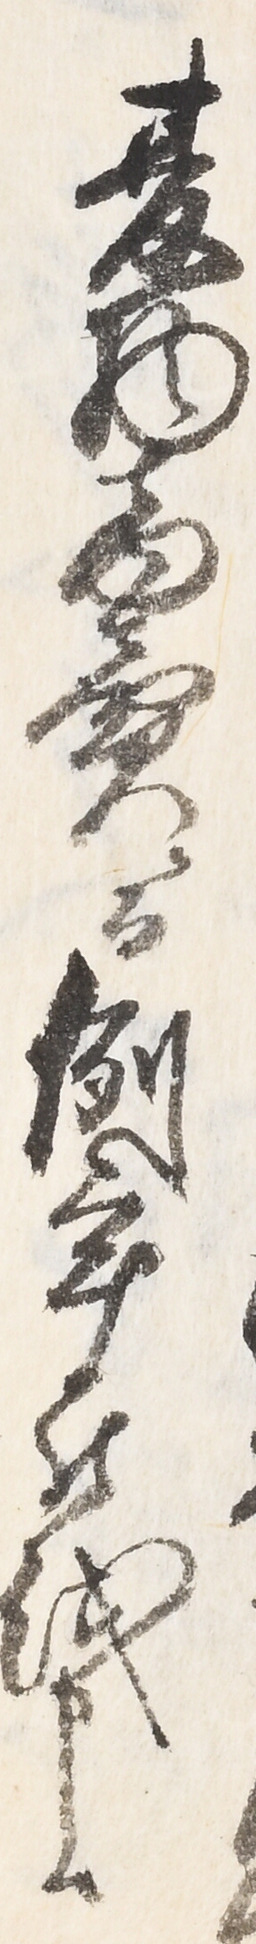小間物商売ニ而例年罷越申候
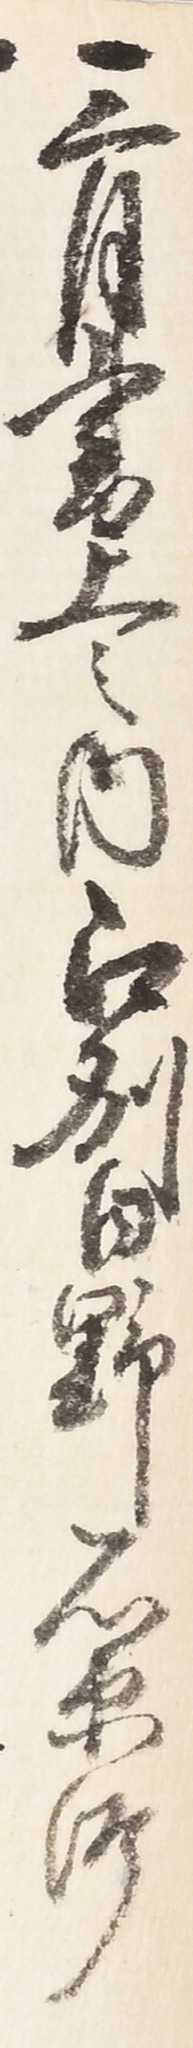三月書上之内江州日野石原町
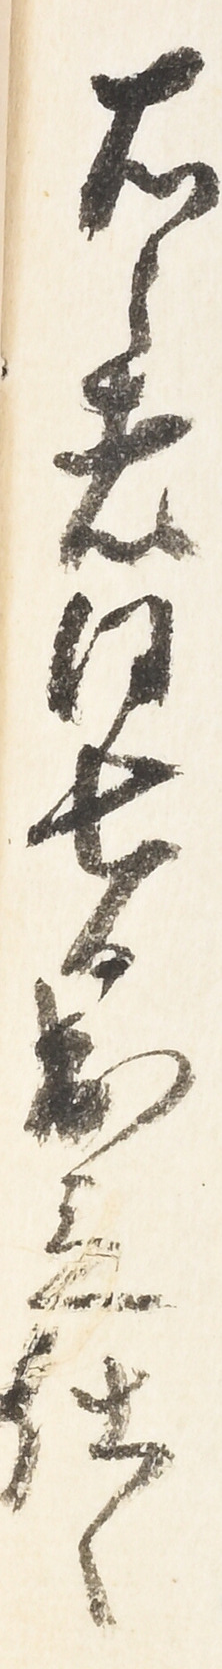右之者同十八日出立仕候
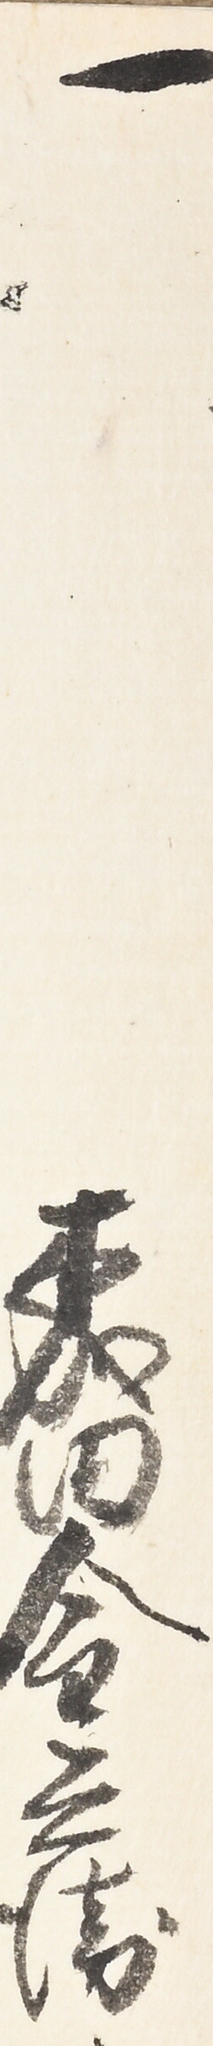一森田金兵衛・
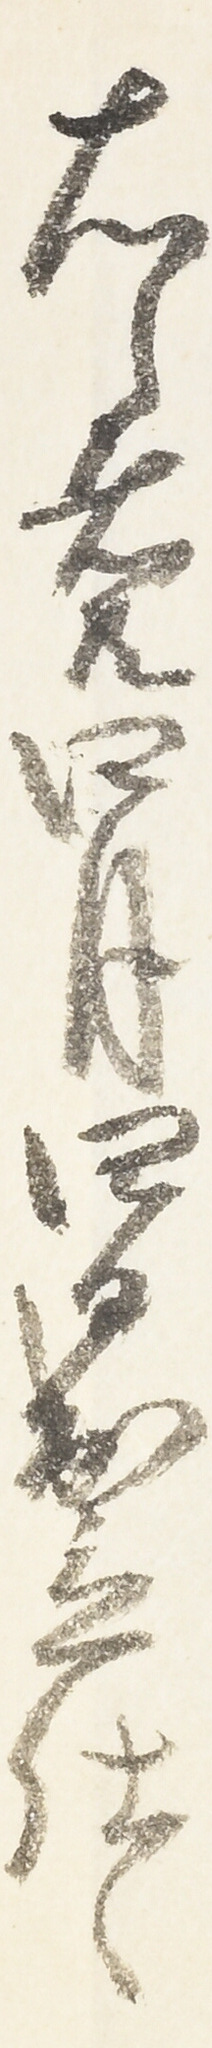右之者共四月四日出立仕候
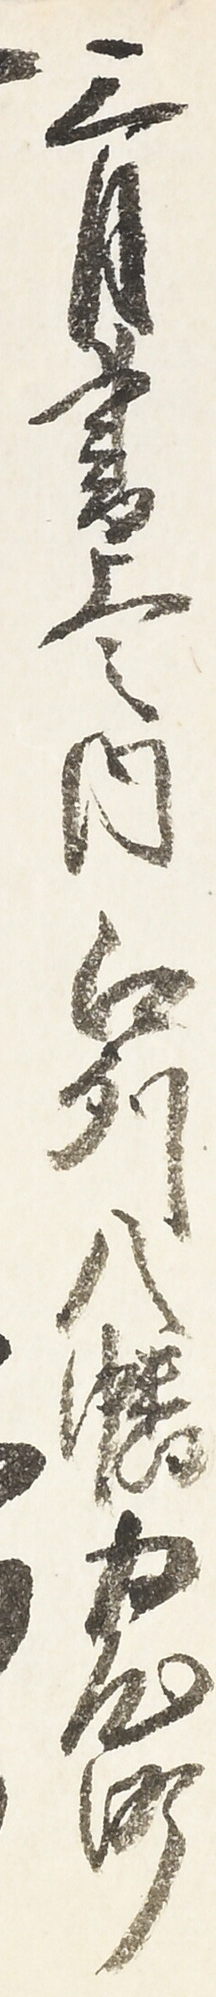三月書上之内江州八幡為心町
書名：町中旅人泊控帳
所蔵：伊那市立高遠町図書館・合同会社AMANE
